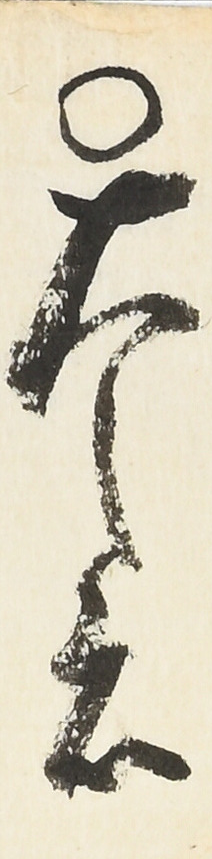〇右之者
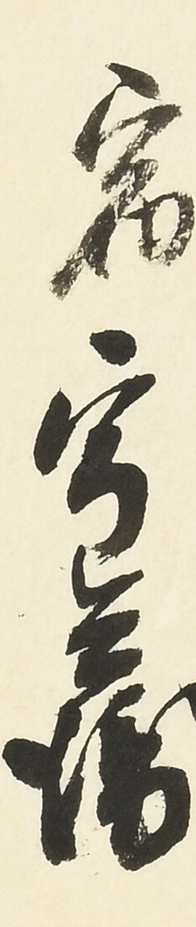宿宇兵衛
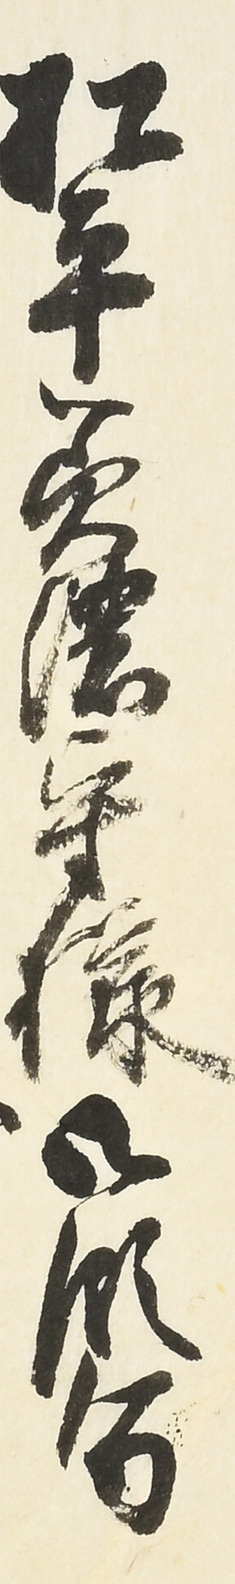松平美濃守様御領分
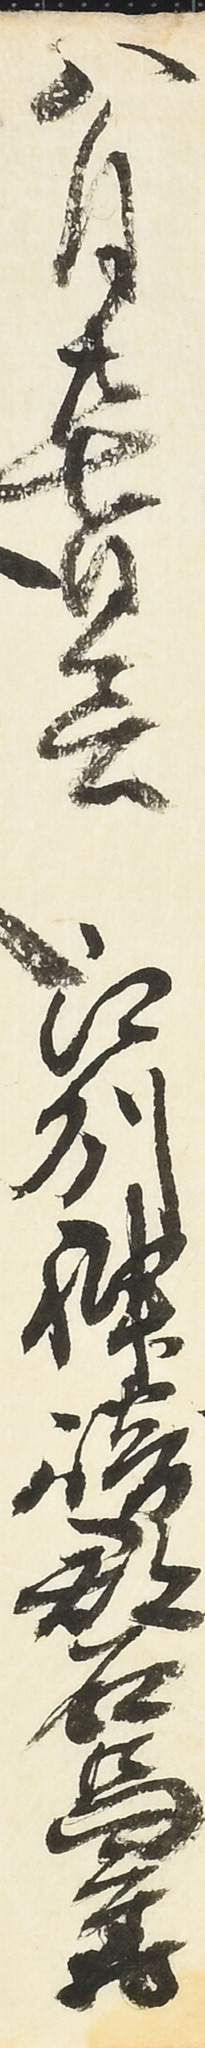八月廿七日着江州神崎郡石馬寺村
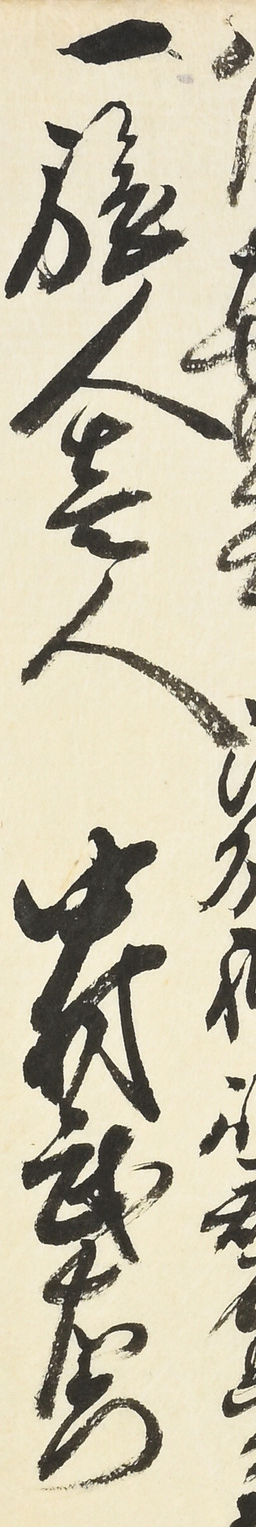一旅人壱人中村武右衛門
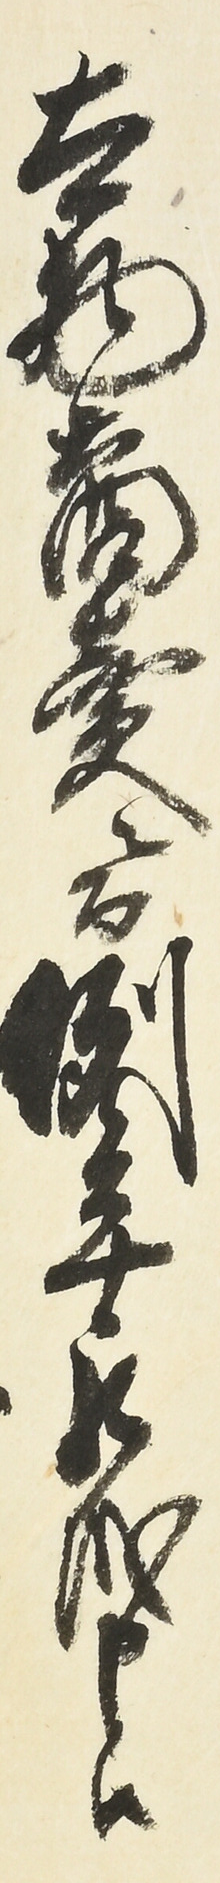太物商売ニ而例年罷越申候
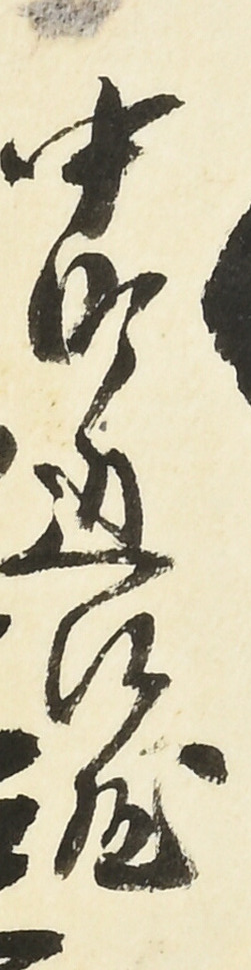中町近江屋
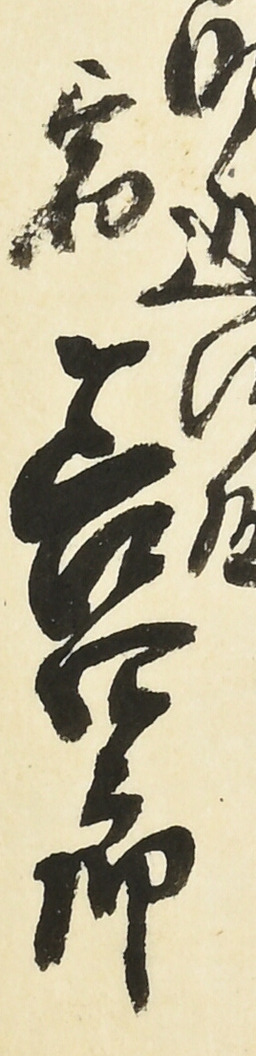宿善四郎
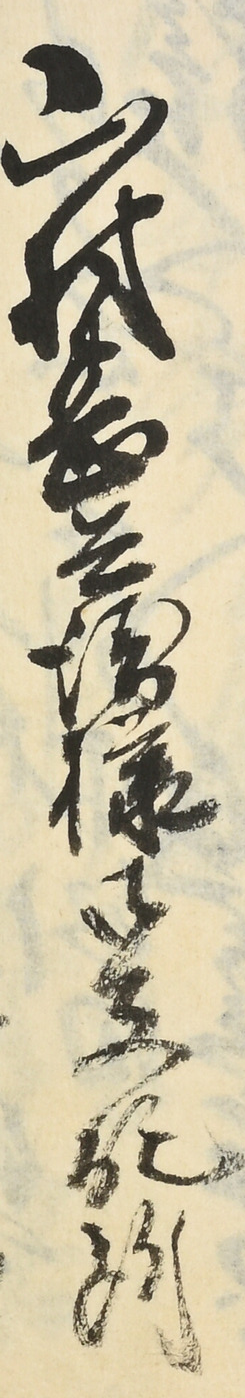山村甚兵衛様御支配所

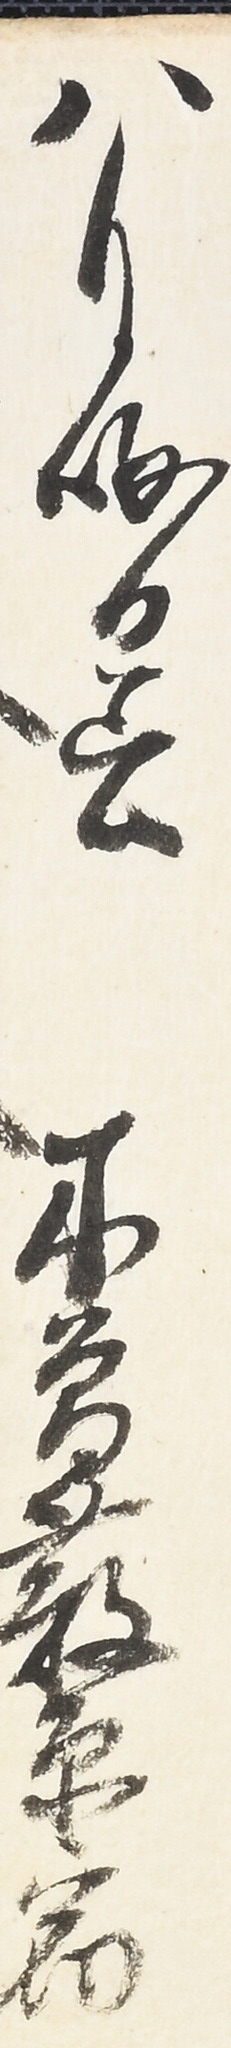八月晦日着木曽藪原宿
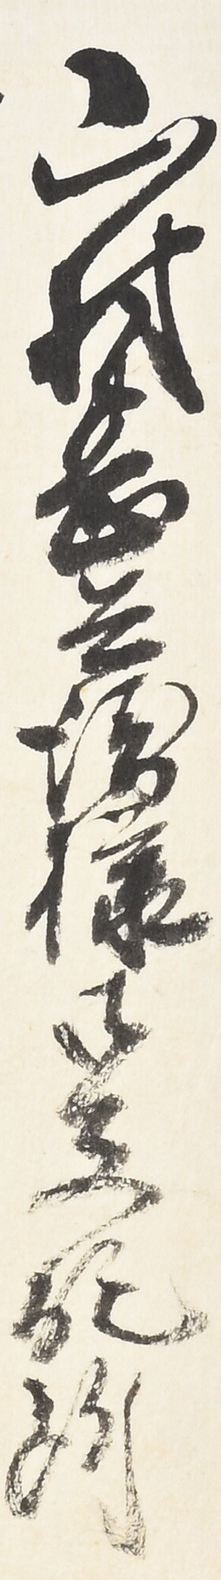山村甚兵衛様御支配所
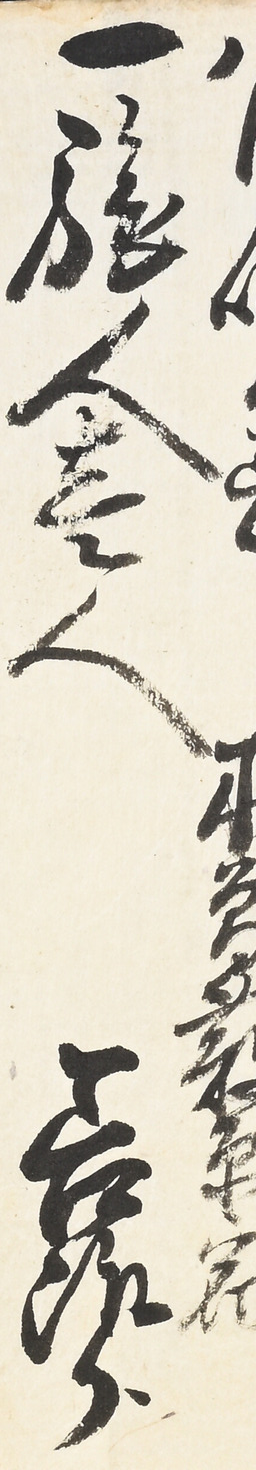一旅人壱人善治郎
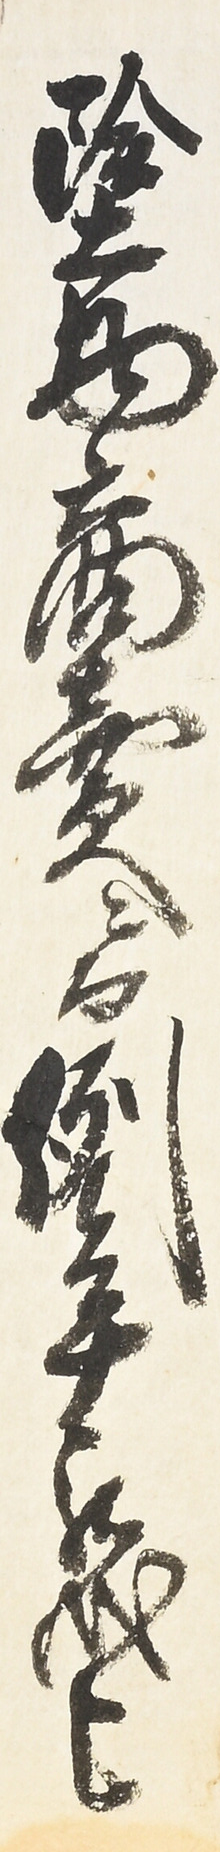塗物商売ニ而例年罷越申候
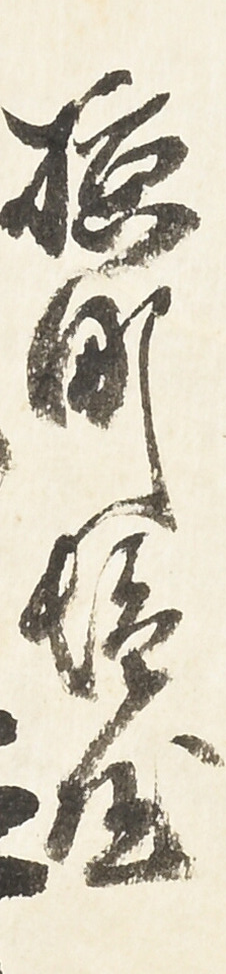横町塩屋
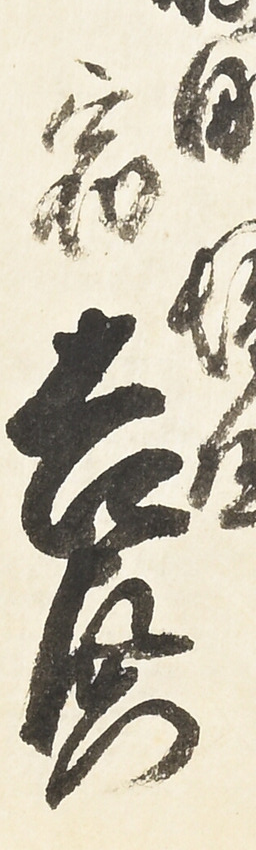宿吉左衛門
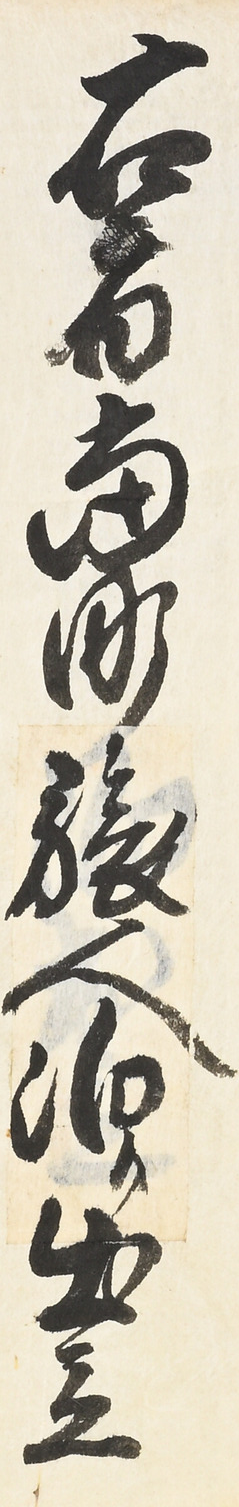右者当町旅人泊リ出立
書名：町中旅人泊控帳
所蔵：伊那市立高遠町図書館・合同会社AMANE
